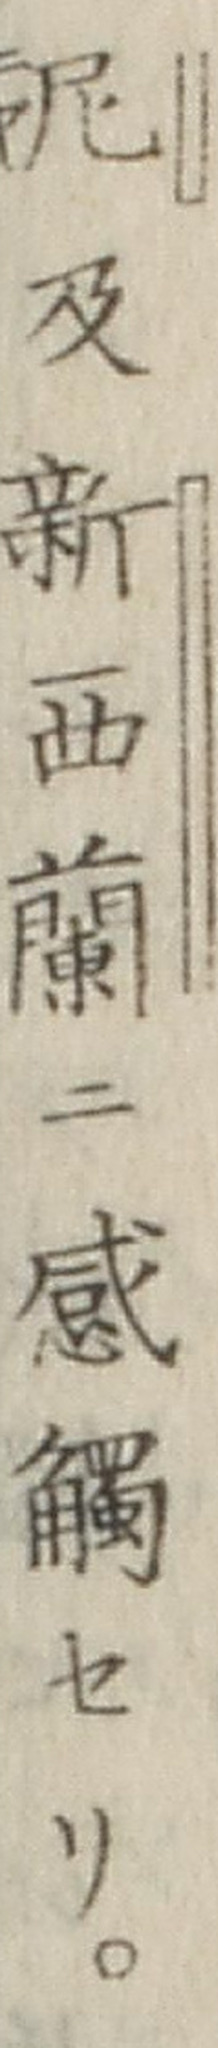尼及新西蘭ニ感触セリ。

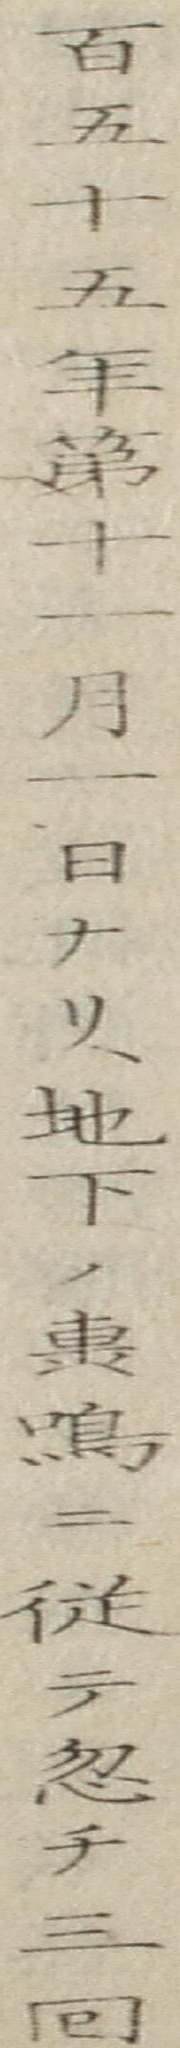百五十五年第十一月一日ナリ、地下ノ軣鳴ニ従テ忽チ三回
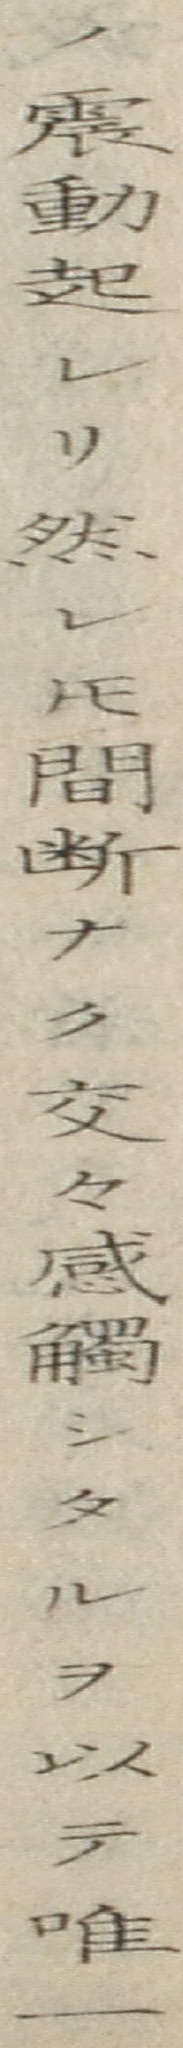ノ震動起レリ然レトモ間断ナク交々感觸シタルヲ以唯一
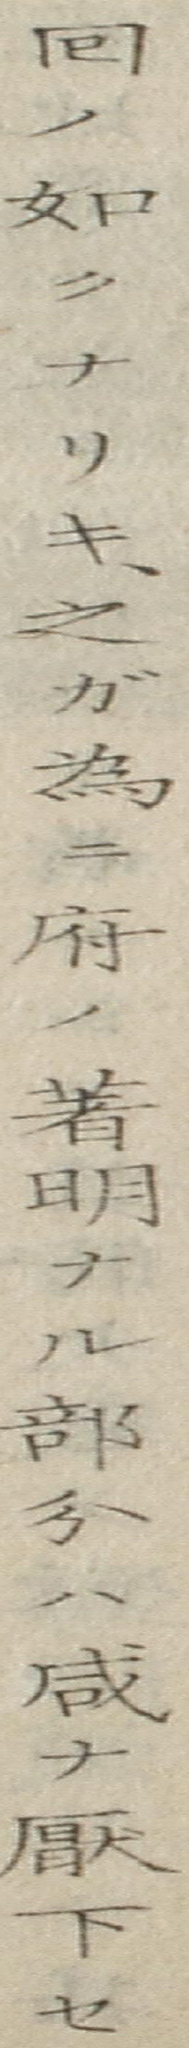回ノ如クナリキ、之ガ為二府ノ著明ナル部分ハ咸ナ厭下セ
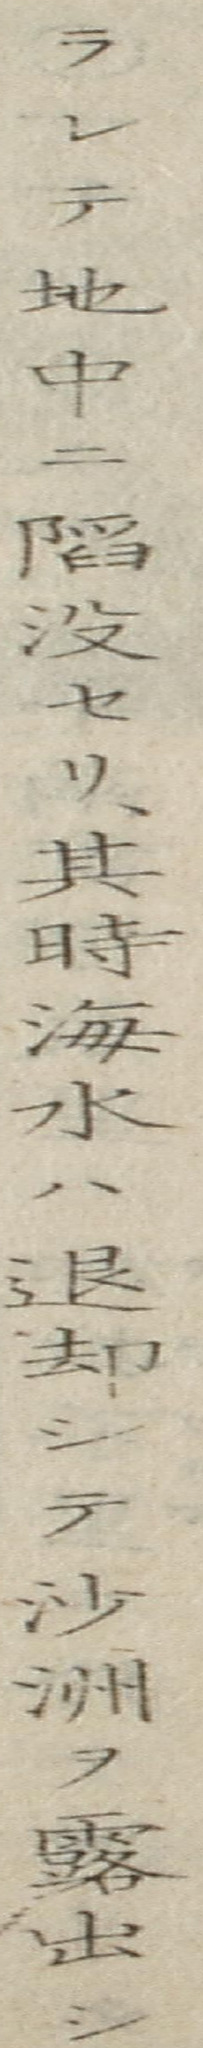ラレテ地中二陥没セリ、其時海水ハ退却シテ沙洲ヲ露出シ
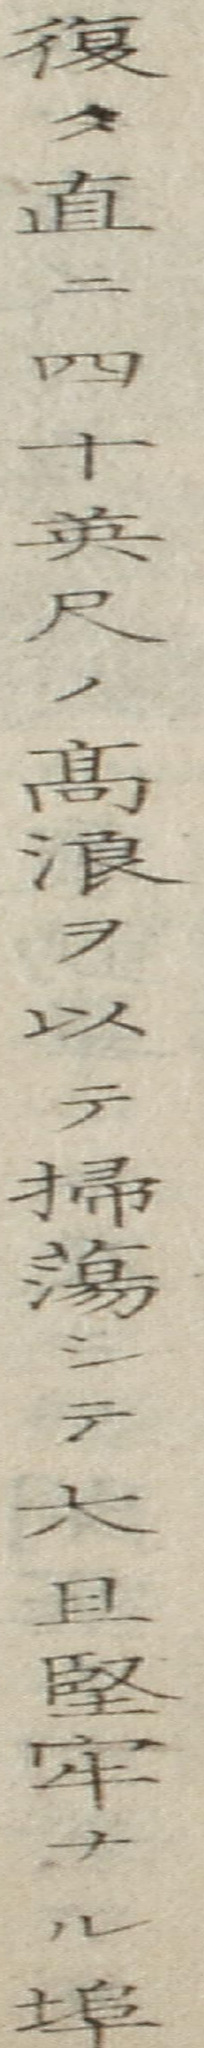復ク直ニ四十英尺ノ髙浪ヲ以テ掃蕩シテ大旦堅牢ナル埠
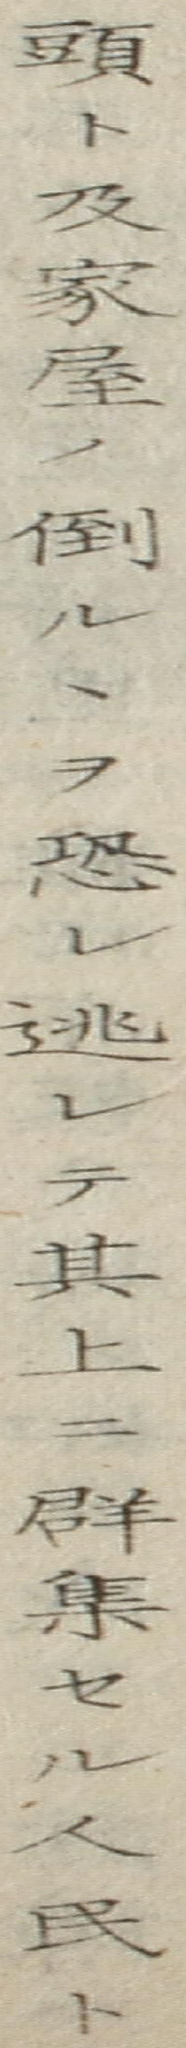頭ト及家屋ノ倒ルヽヲ恐レ逃レテ其上ニ群集セル人民ト
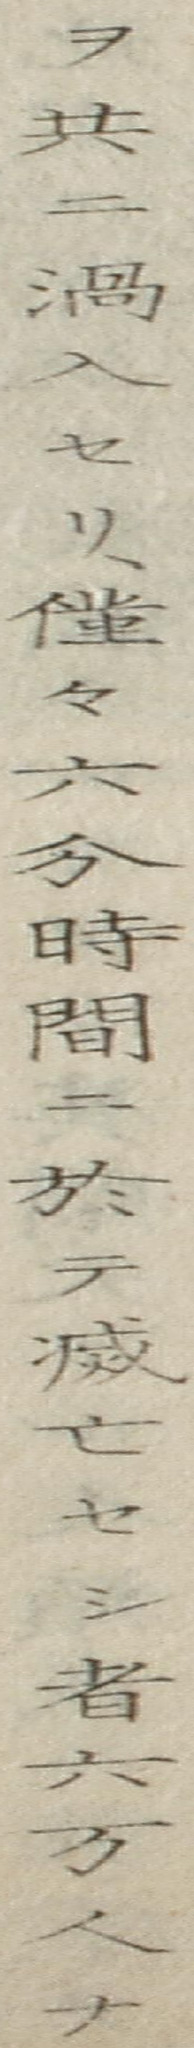ヲ共ニ渦入セリ、僅々六分時間ニ於テ滅亡セシ者六万人ナ
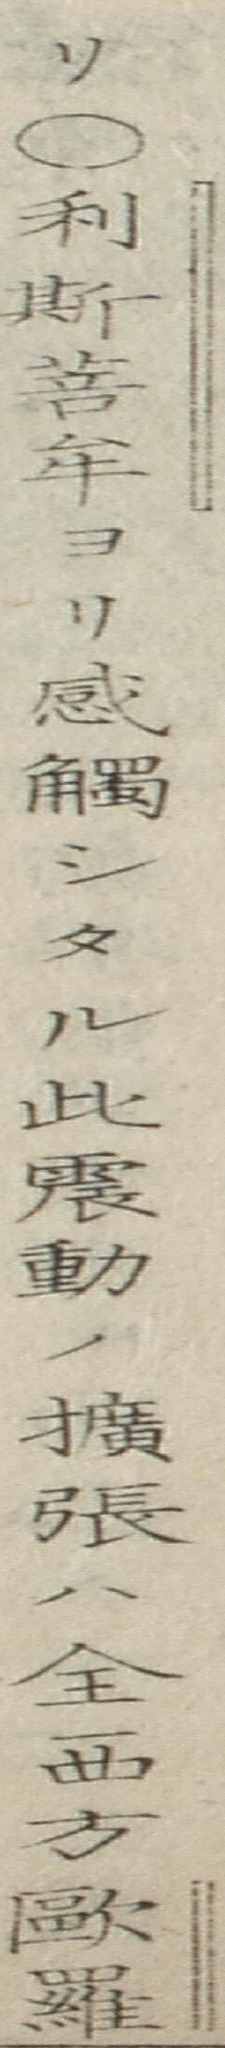リ○利斯菩牟ヨリ感觸シタル此震動ノ擴張ハ全西方歐羅
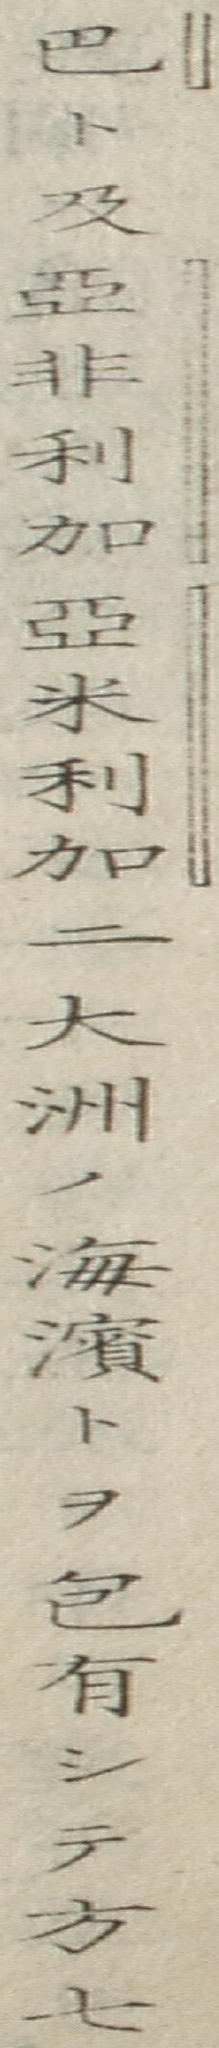巴ト及亞非利加亞米利加ニ大洲ノ海濱トヲ包有シテ方七
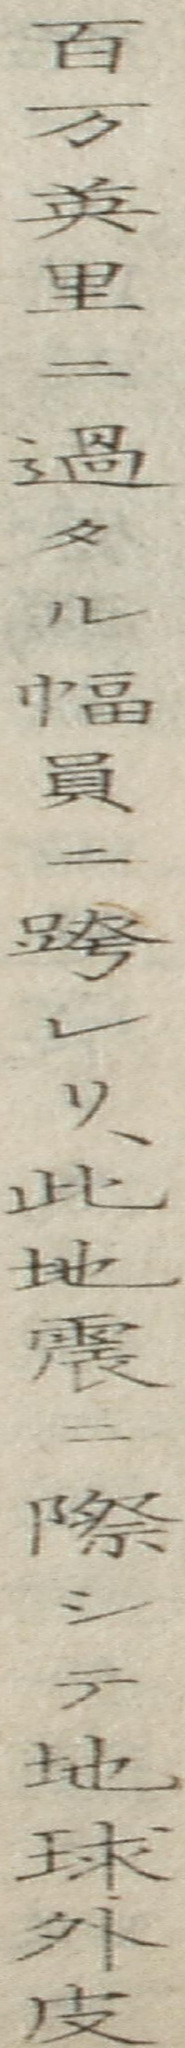百万英里ニ過タル幅員ニ跨レリ、此地震ニ際シテ地球外皮
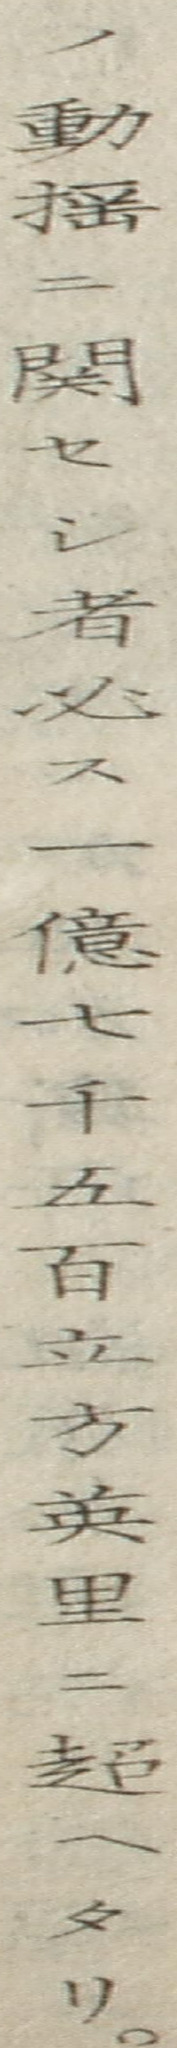ノ動揺ニ関セシ者必ス一億七千五百立方英里ニ超ヘタリ。
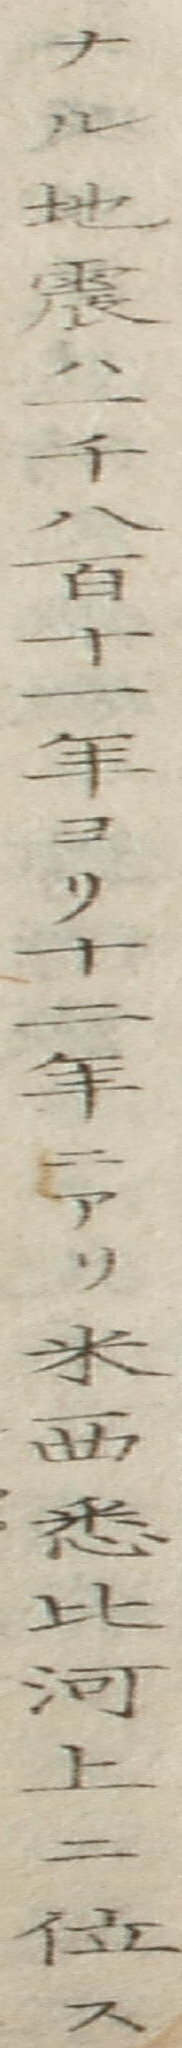ナル地震ハ一千八百十一年ヨリ十二年ニアリ米西悉比河上ニ位ス
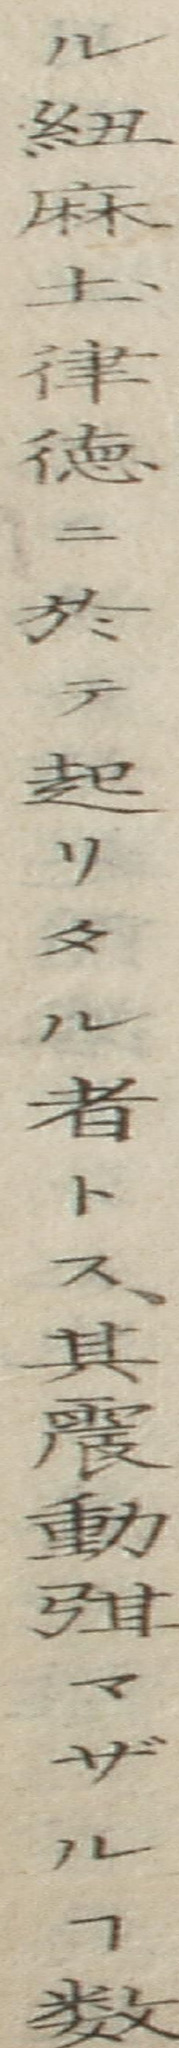ル紐麻土律徳ニ於テ起リタル者トス、其震動弭マザルヿ数

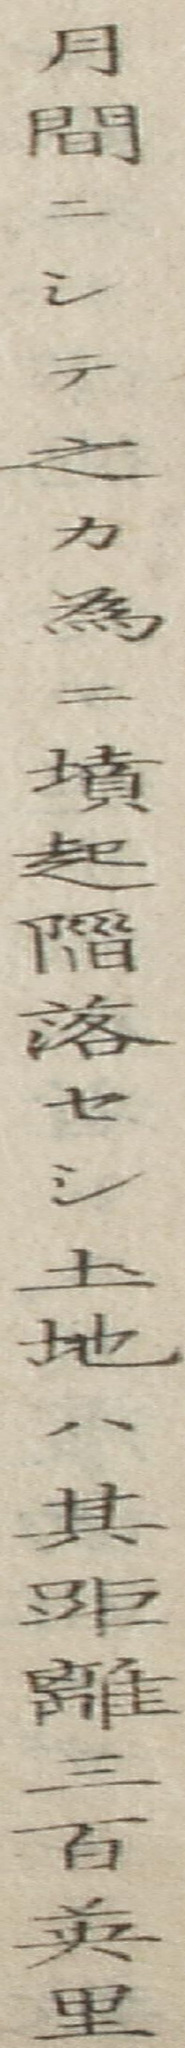月間ニシテ之カ為ニ墳起陥落セシ土地ハ其距離三百英里
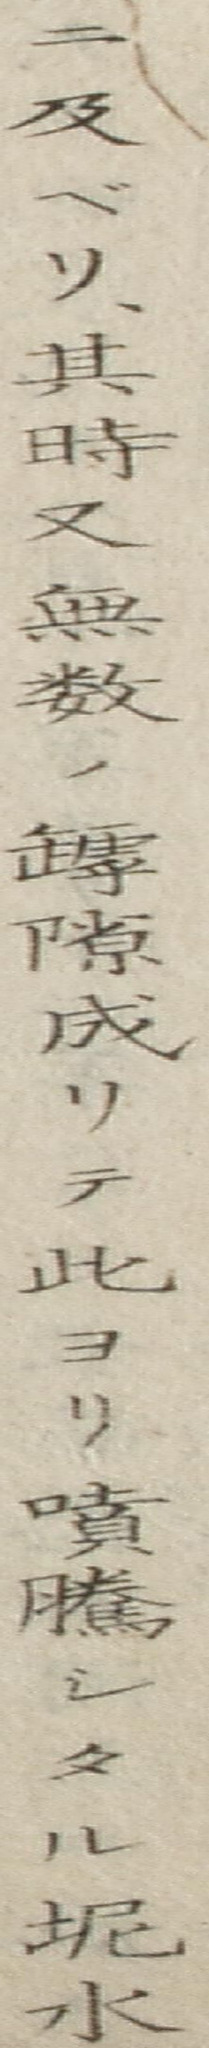ニ及ベリ、其時又無数ノ罅隙成リテ此ヨリ噴騰シタル坭水
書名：地形論　巻二
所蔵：東京大学地震研究所図書室 Earthquake Research Institute Library, The University of Tokyo, JAPAN
